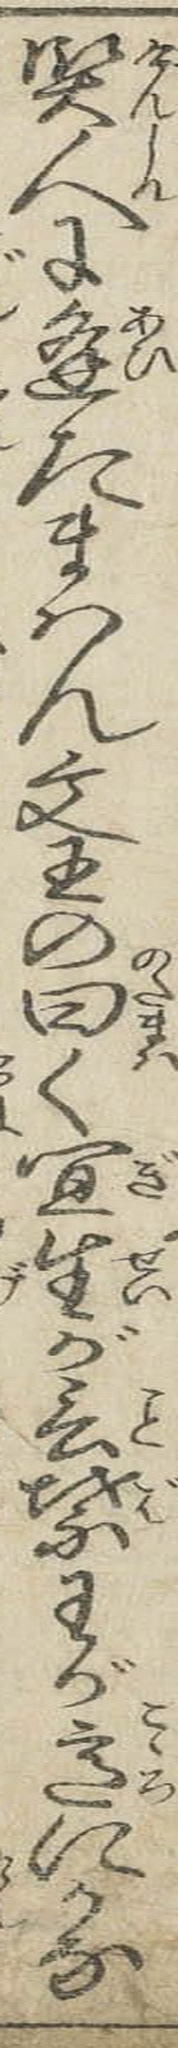賢人に逢たまはん文王の曰く宜生が言葉わが意にかな
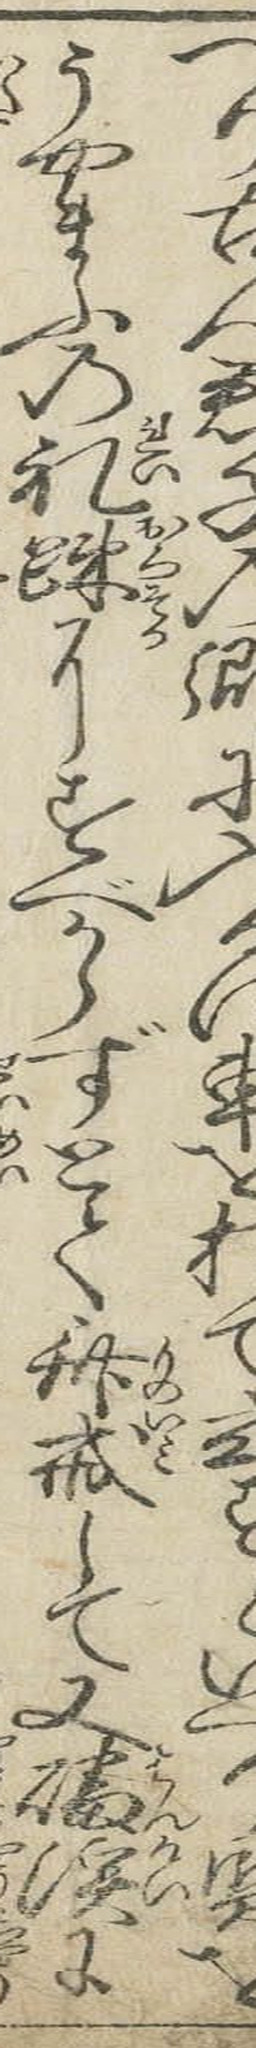うやまふの礼疎にすべからずとて斎戒して又磻溪に
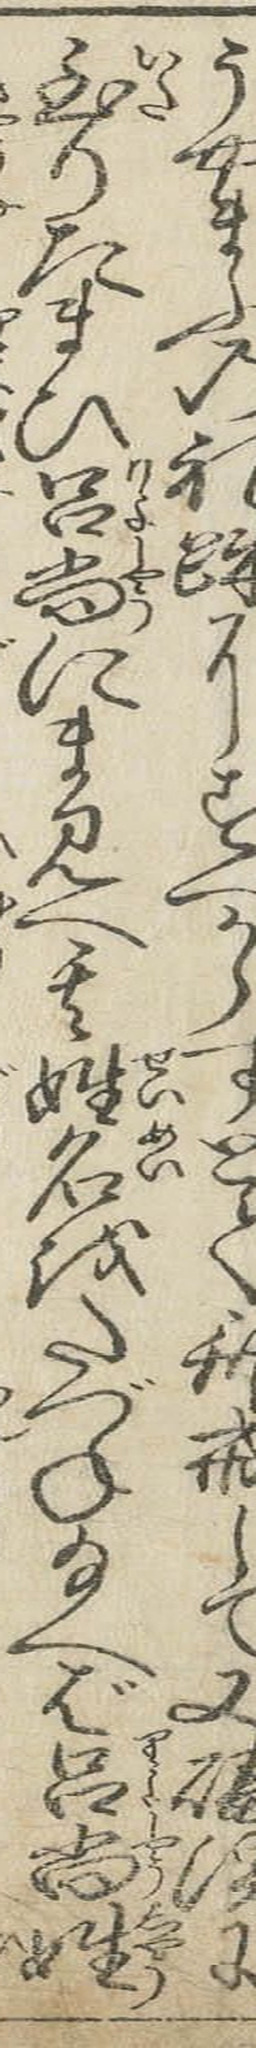至りたまひ呂尚にまみへ其姓名をたづね給へば呂尚姓
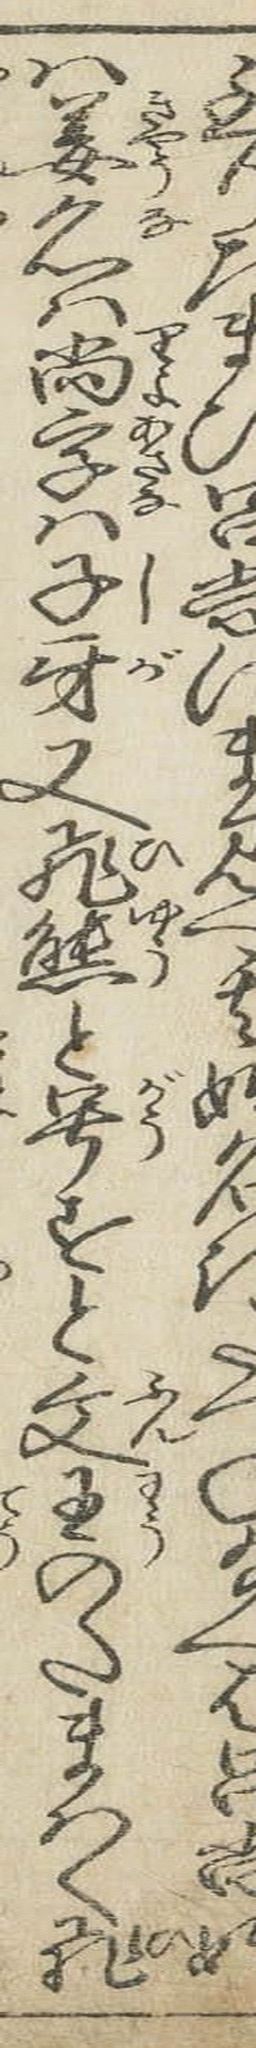は姜名は尚字は子牙又飛熊と号すと文王のたまはく飛
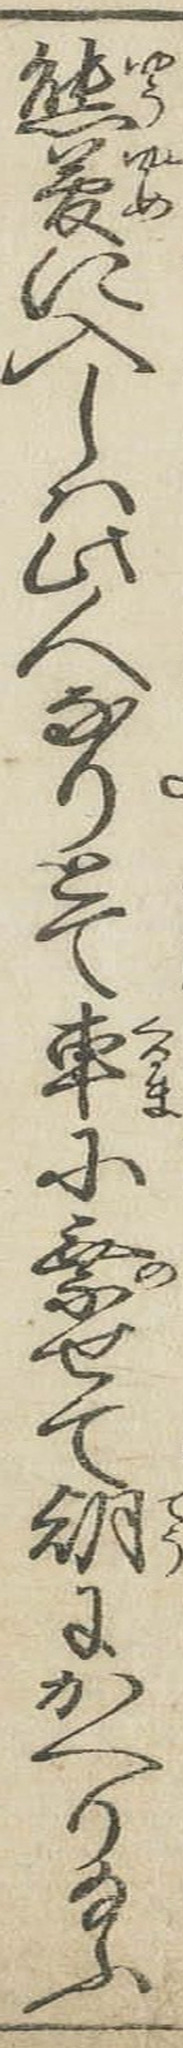熊夢に入しは此人なりとて車に乗せて朝にかへり給ふ
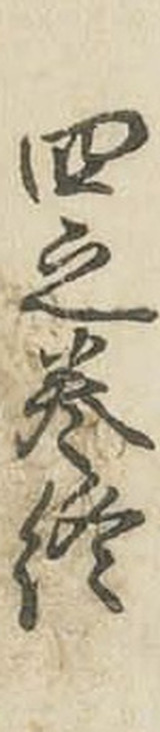四之巻終
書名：絵本写宝袋 9巻 4之巻
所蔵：東京学芸大学教育コンテンツアーカイブ
